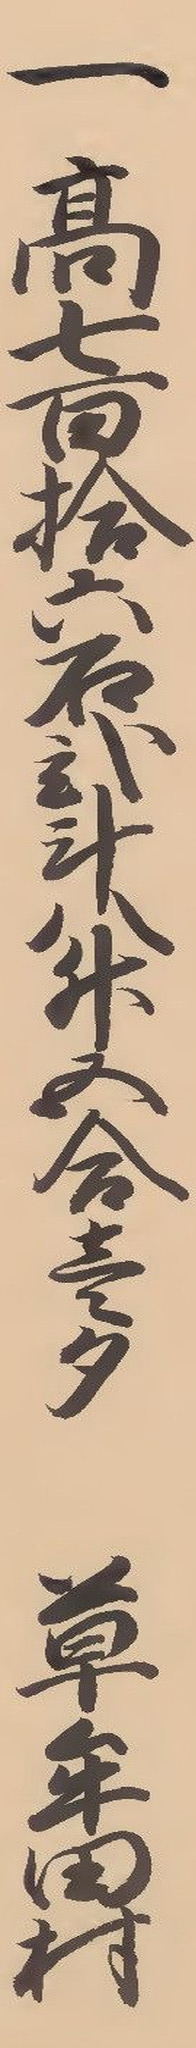一高七百拾六石弐斗八升五合壱勺草牟田村
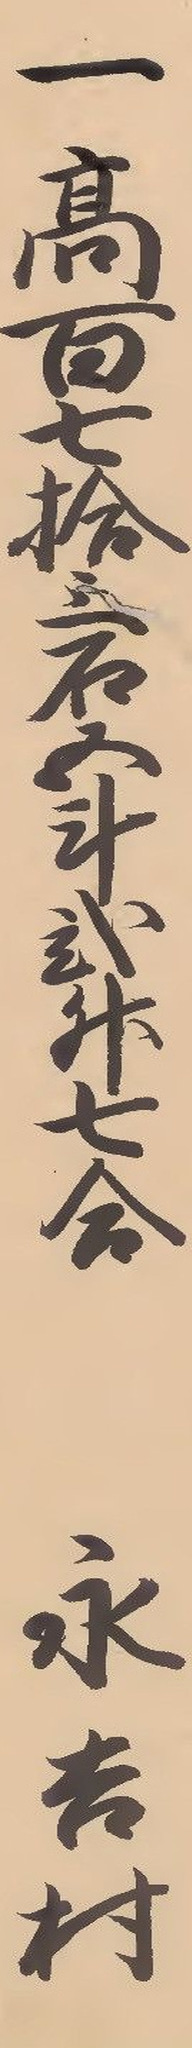一高百七拾三石五斗弐升七合永吉村

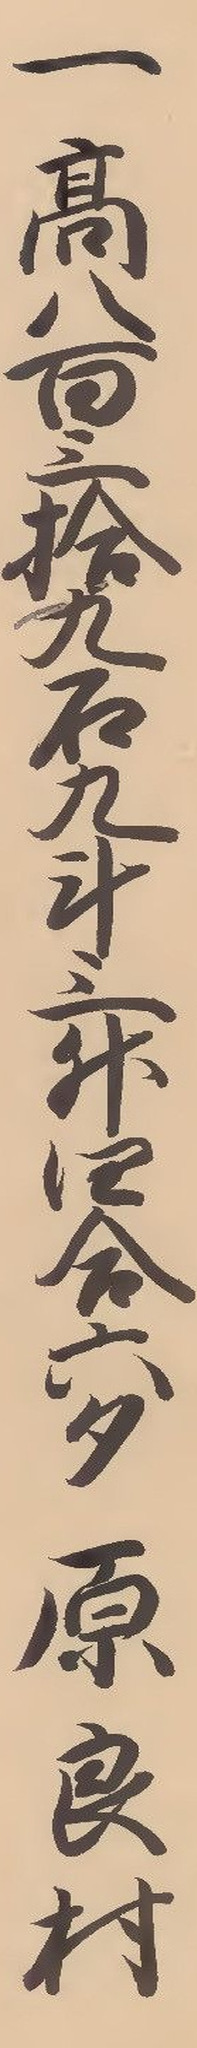一高八百三拾九石九斗三升四合六勺原良村
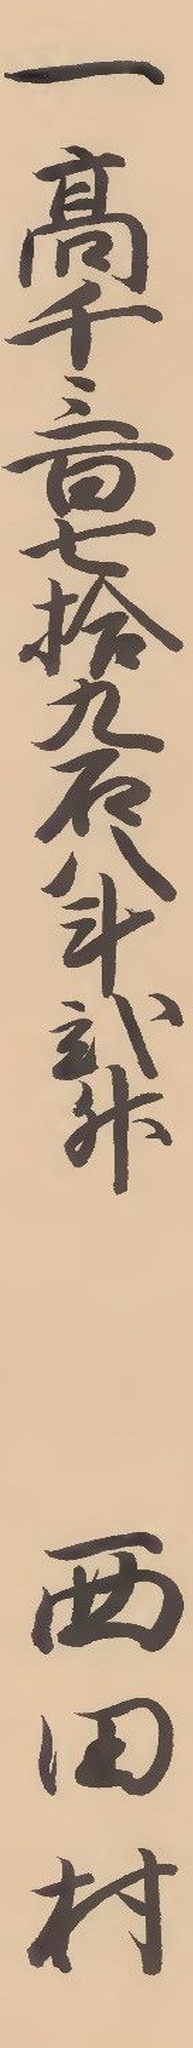一高千三百七拾九石八斗弐升西田村
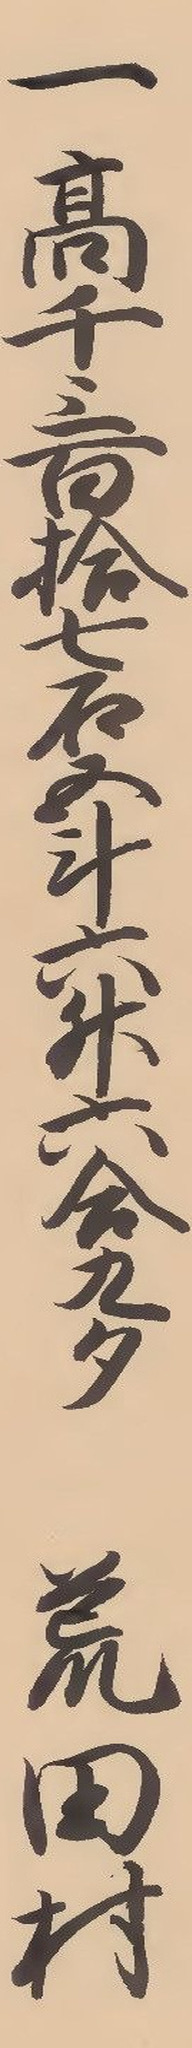一高千三百拾七石五斗六升六合九勺荒田村
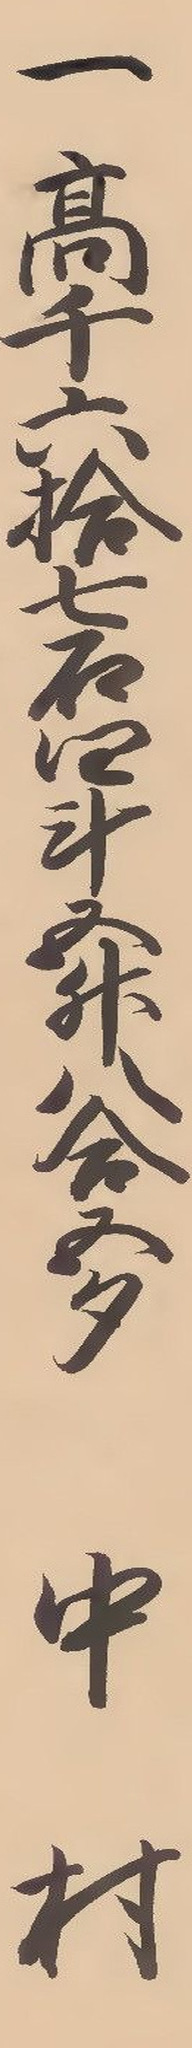一高千六拾七石四斗五升八合五勺中村
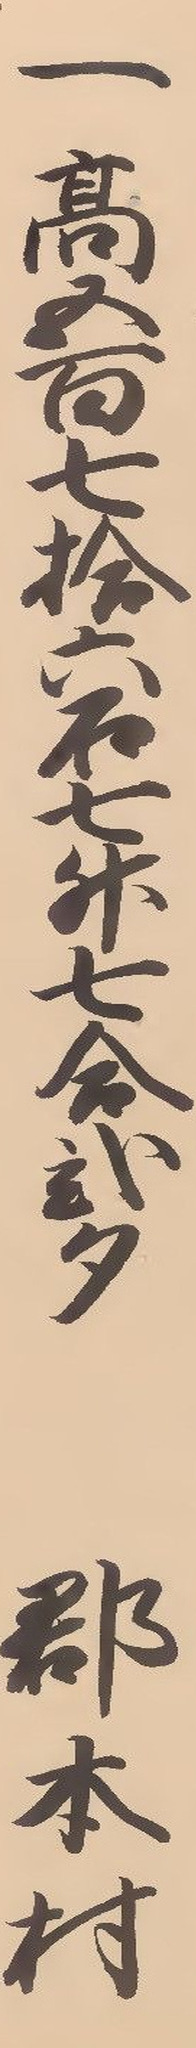一高五百七拾六石七升七合弐勺郡本村
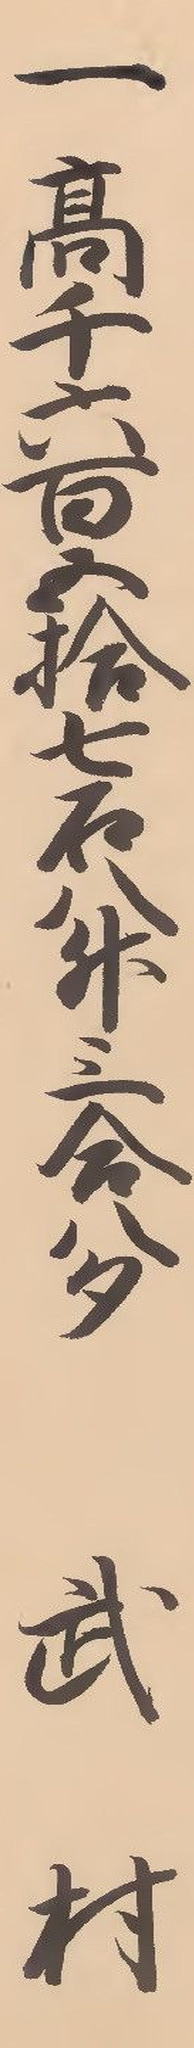一高千六百五拾七石八升三合八勺武村
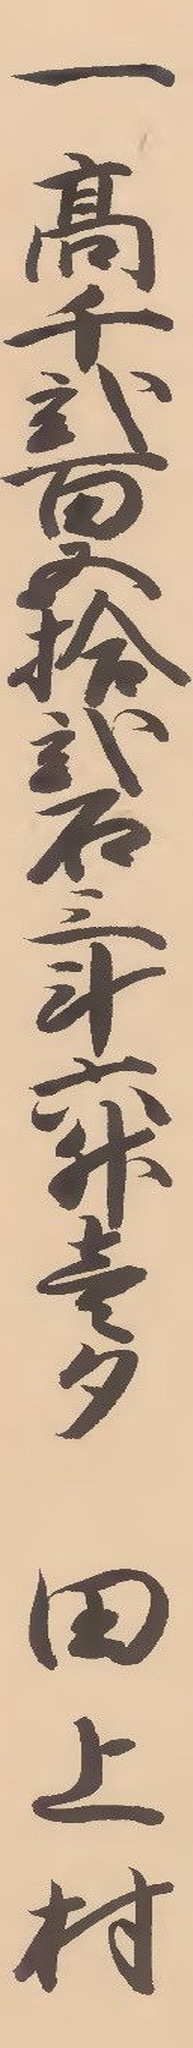一高千弐百五拾弐石三斗六升壱勺田上村
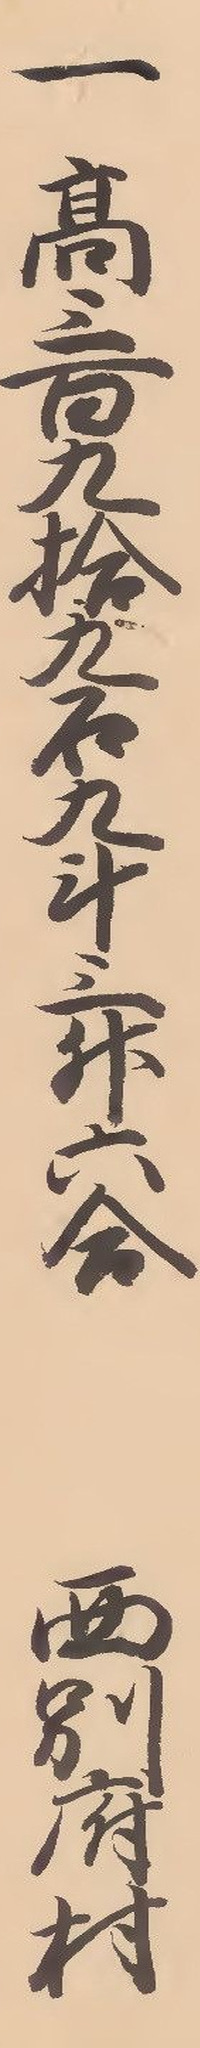一高三百九拾九石九斗三升六合西別府村

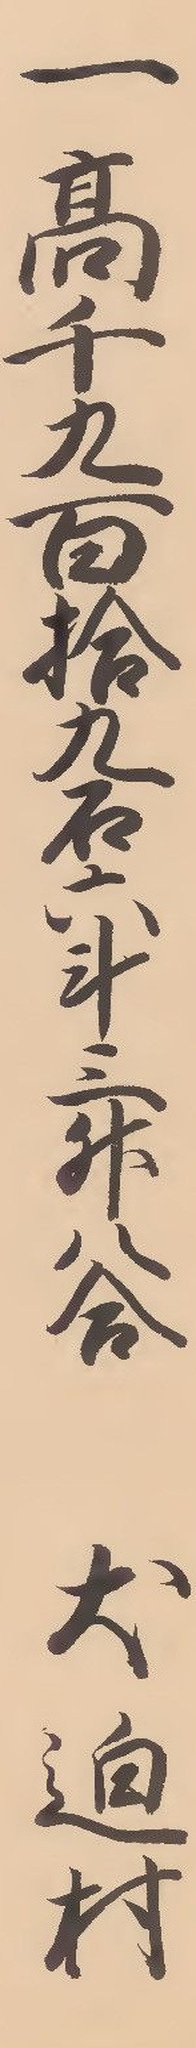一高千九百拾九石六斗三升八合犬迫村
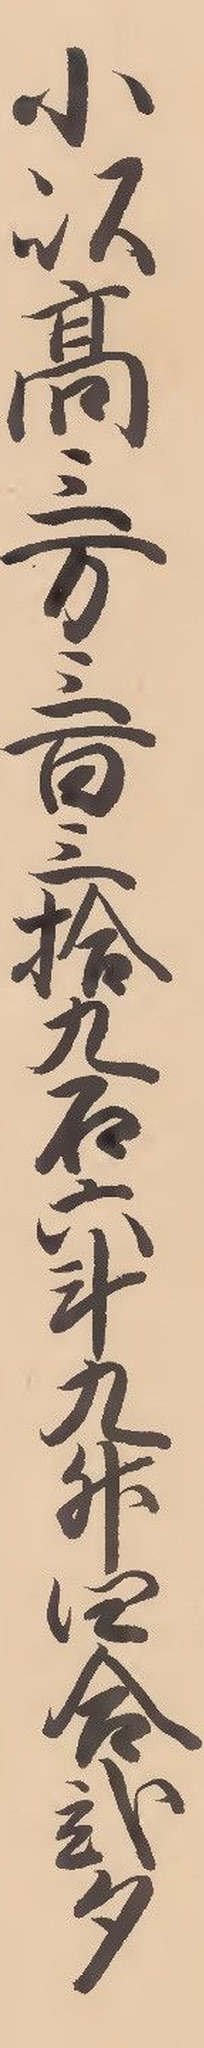小以高三万三百三拾九石六斗九升四合弐勺
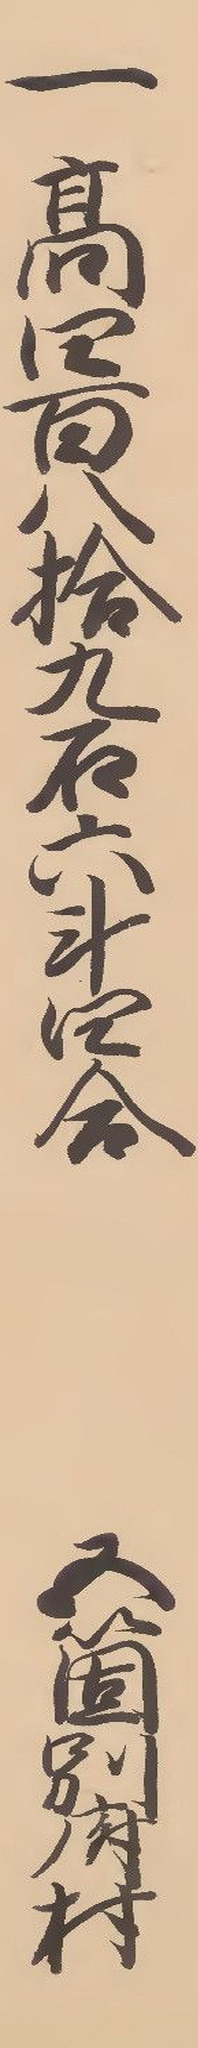一高四百八拾九石六斗四合五箇別府村
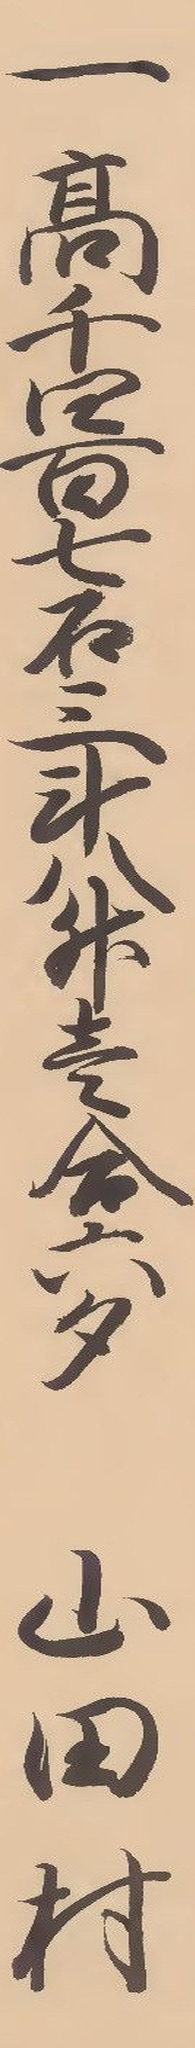一高千四百七石三斗八升壱合六勺山田村
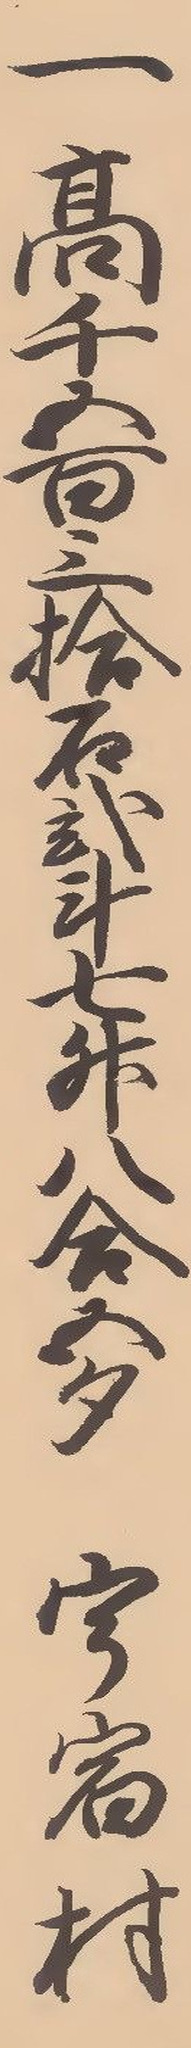一高千五百三拾石弐斗七升八合五勺宇宿村

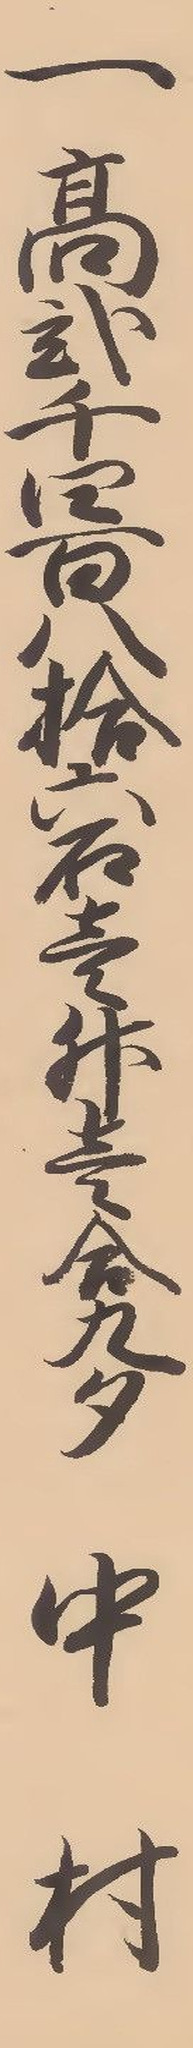一高弐千四百八拾六石壱升壱合九勺中村
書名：薩摩国郷帳
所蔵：国立公文書館 National Archives of Japan
